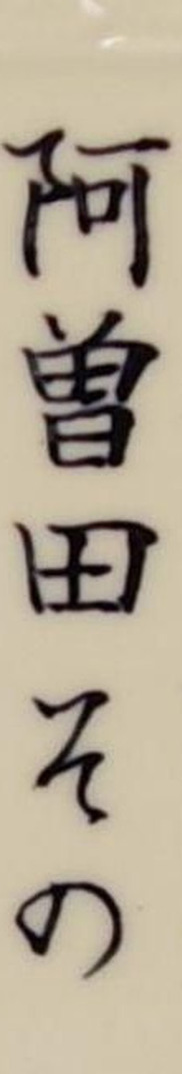阿曽田その
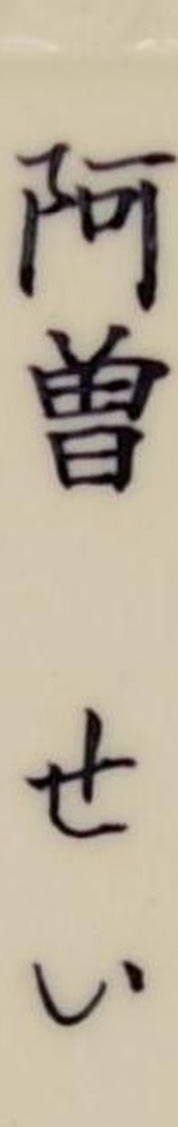阿曽せい
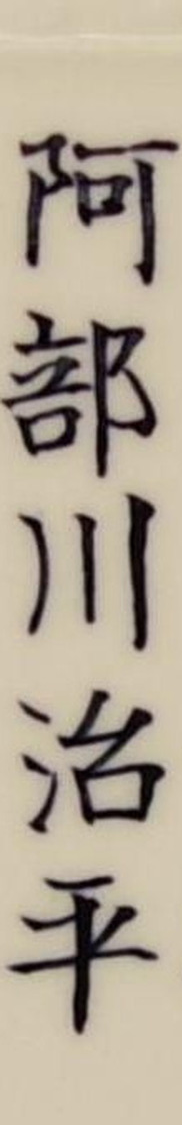阿部川治平
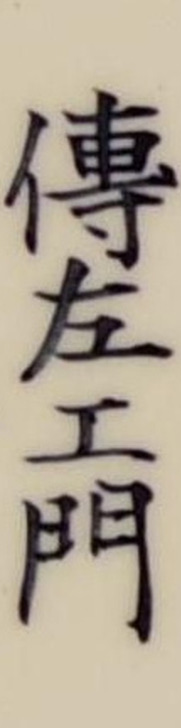傳左エ門
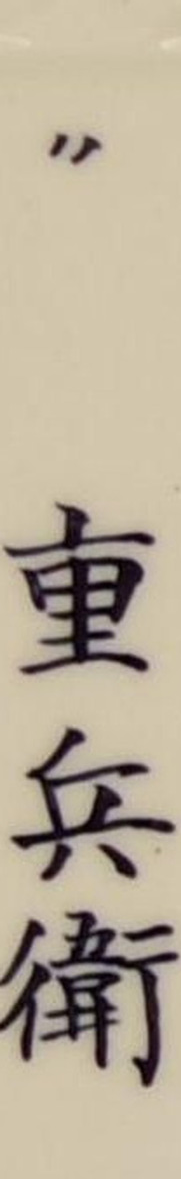重兵衛
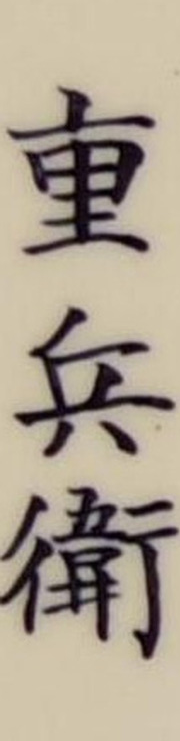重兵衛
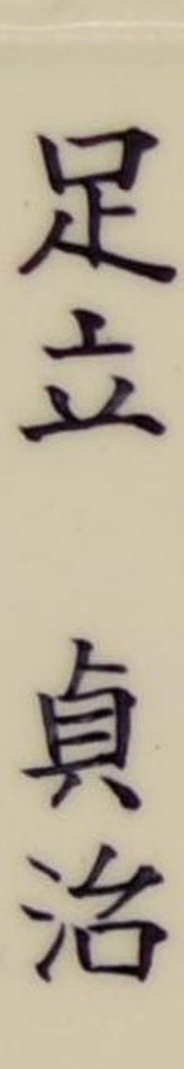足立貞治
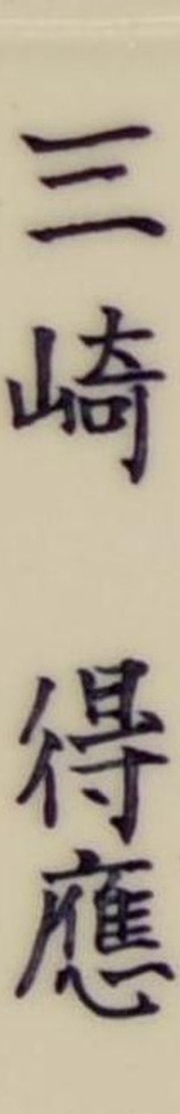三崎得應

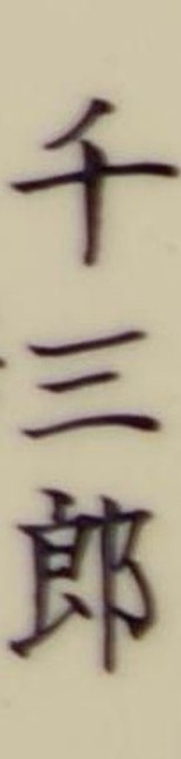千三郎
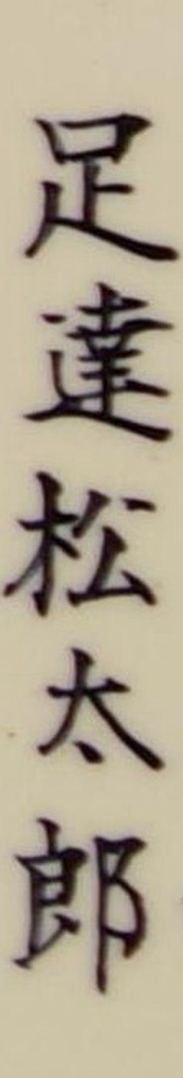足達松太郎
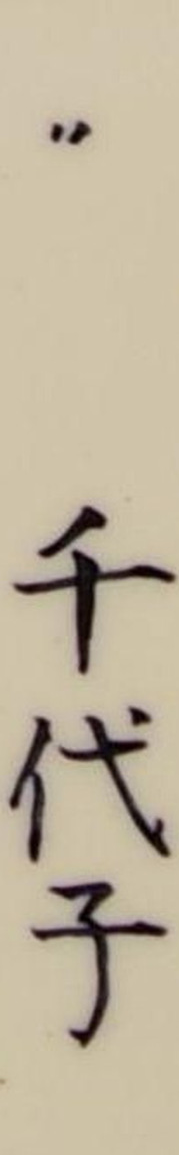千代子
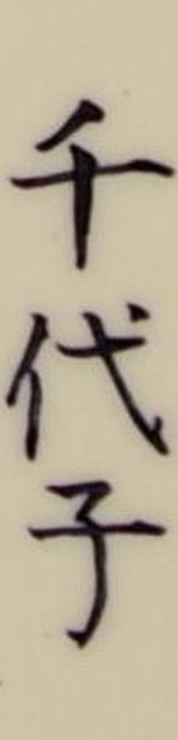千代子
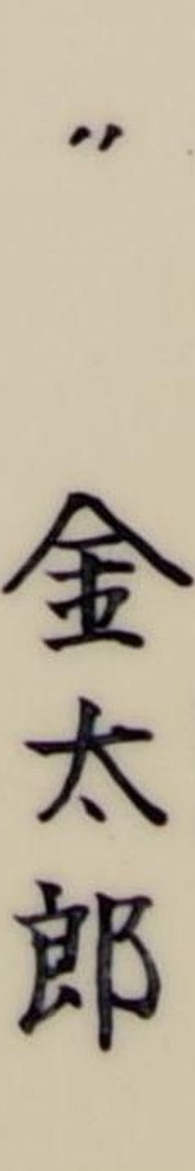金太郎
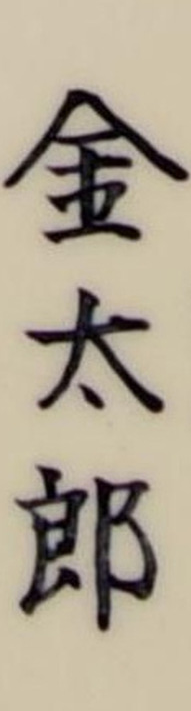金太郎
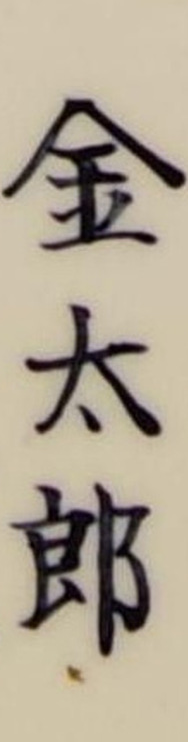金太郎
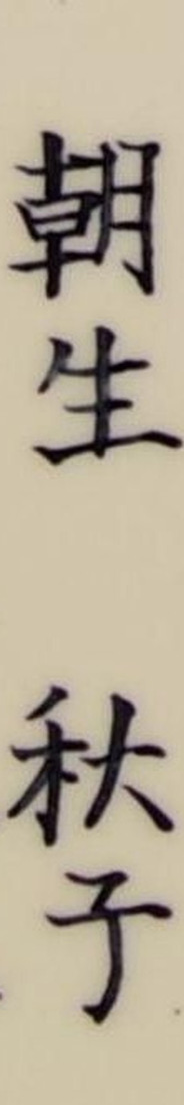朝生秋子
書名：E~L
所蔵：高野山金剛峯寺
